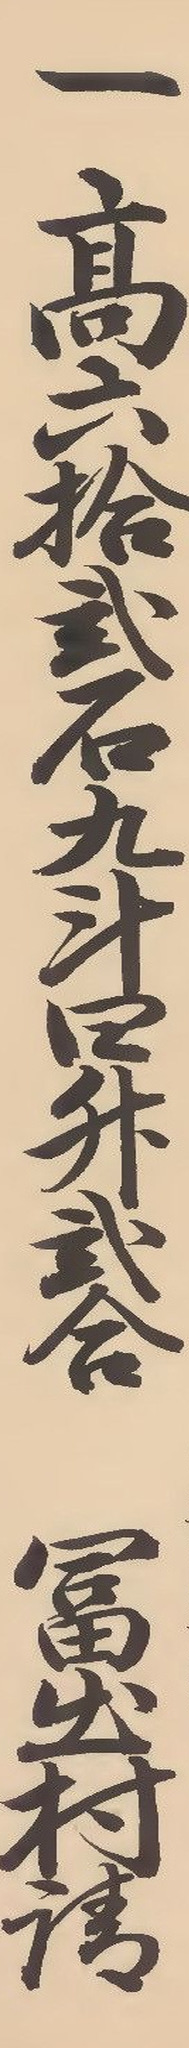一高六拾弐石九斗四升弐合富出村請
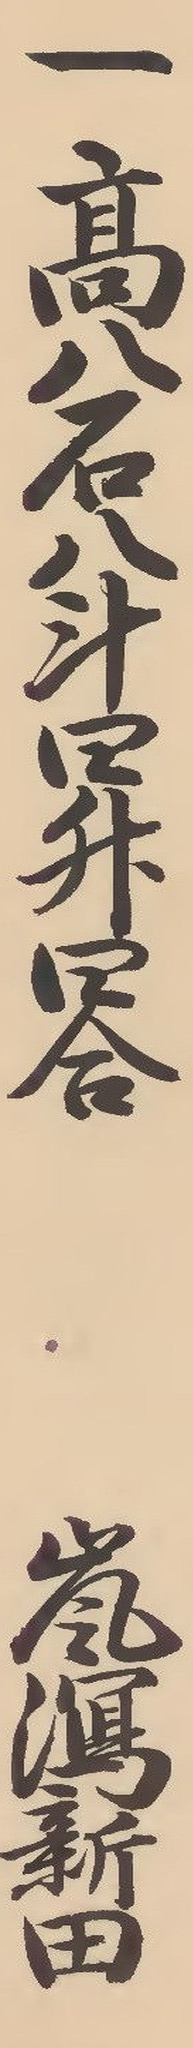一高八石八斗四升四合嵐潟新田

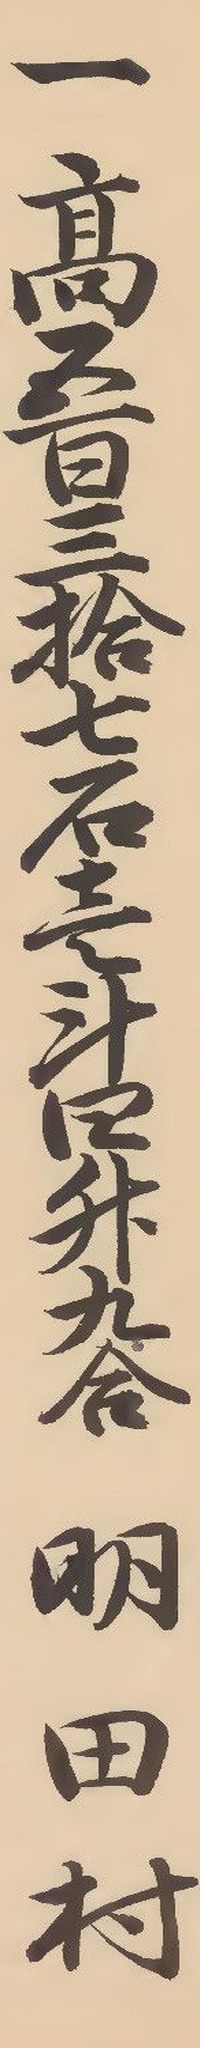一高五百三拾七石壱斗四升九合明田村
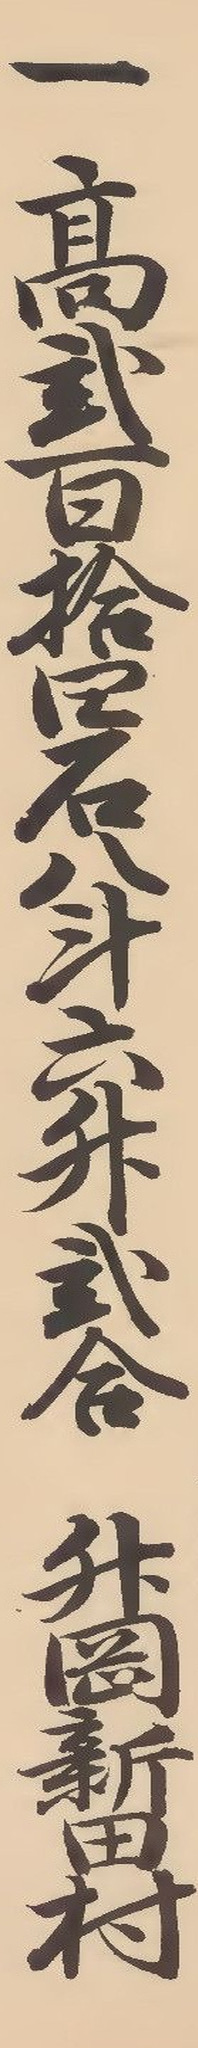一高弐百拾四石八斗六升弐合升岡新田村
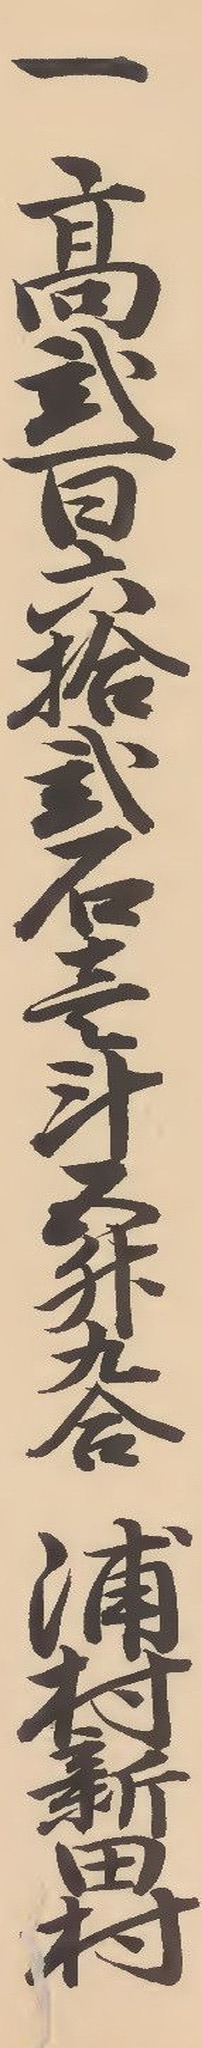一高弐百六拾弐石壱斗五升九合浦村新田村
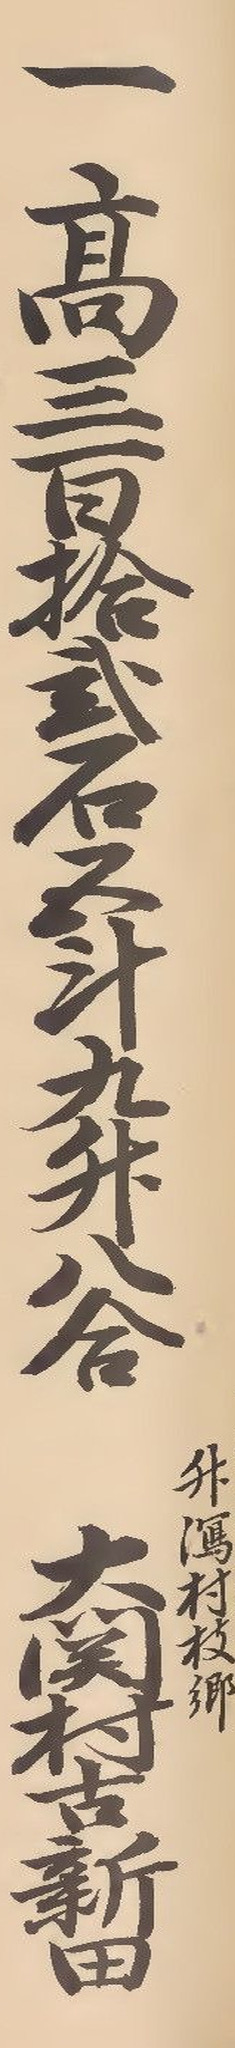一高三百拾弐石五斗九升八合大関村古新田
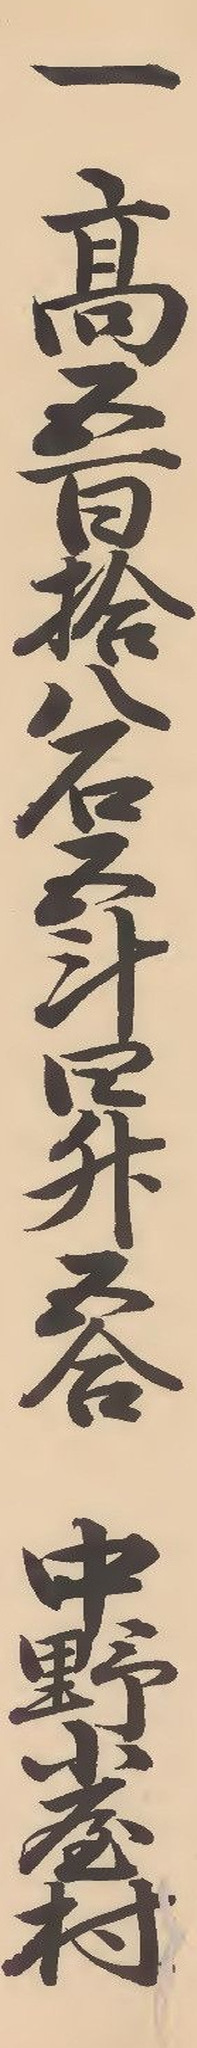一高五百拾八石五斗四升五合中野小屋村
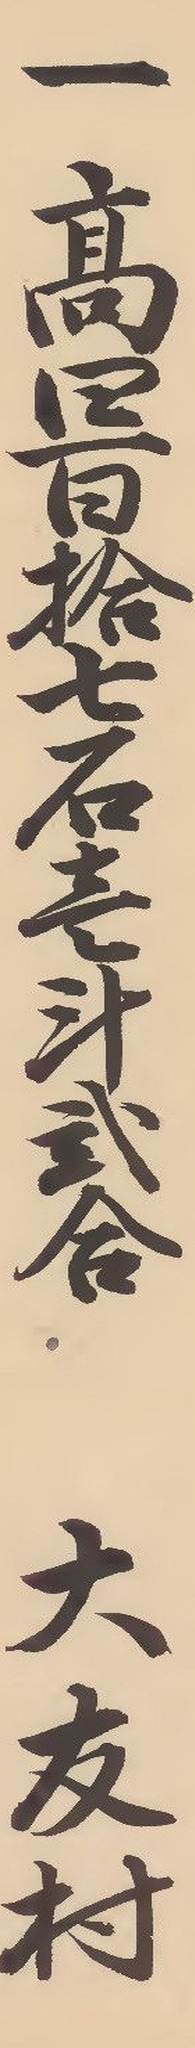一高四百拾七石壱斗弐合大友村

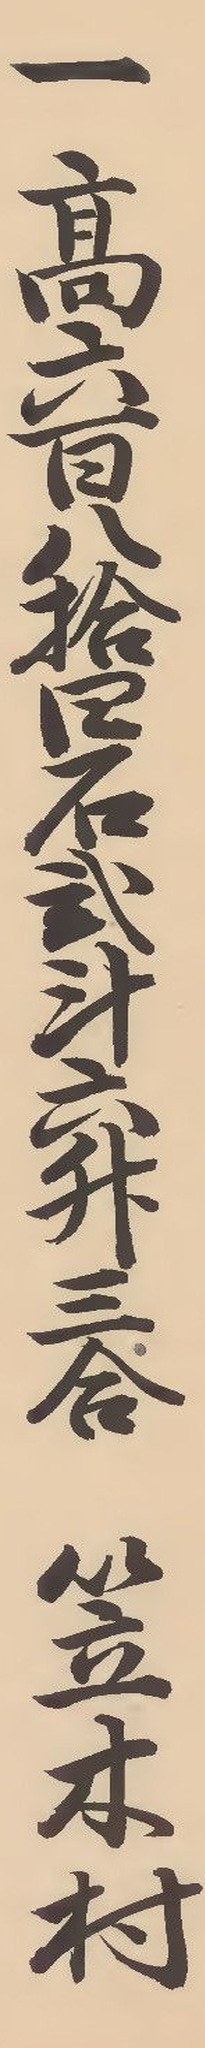一高六百八拾四石弐斗六升三合笠木村
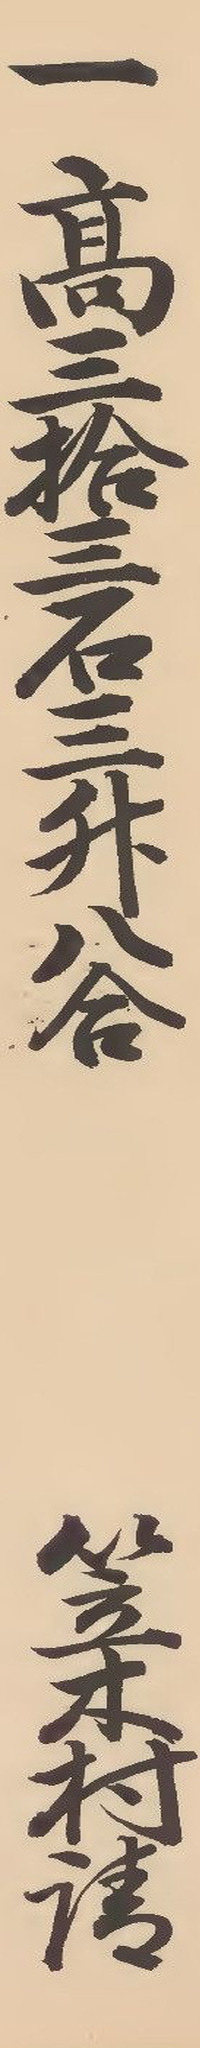一高三拾三石三升八合笠木村請
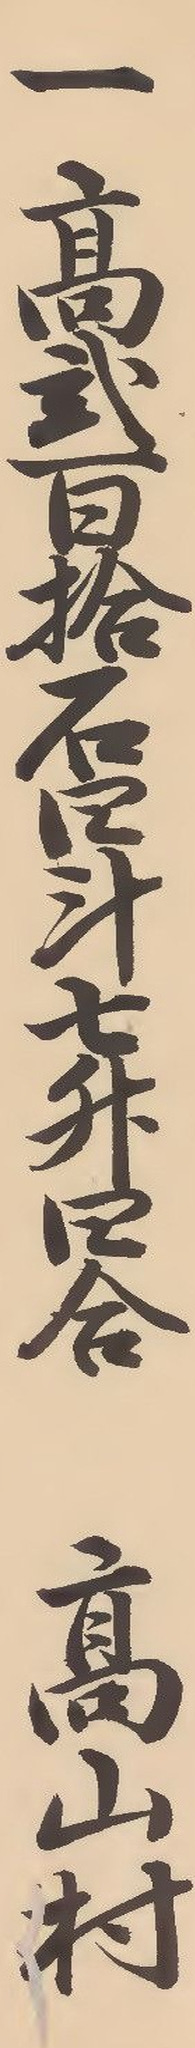一高弐百拾石四斗七升四合高山村
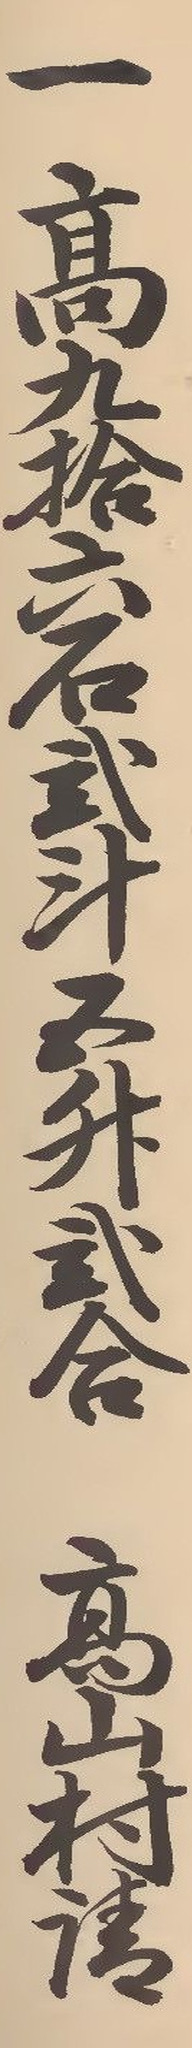一高九拾六石弐斗五升弐合高山村請
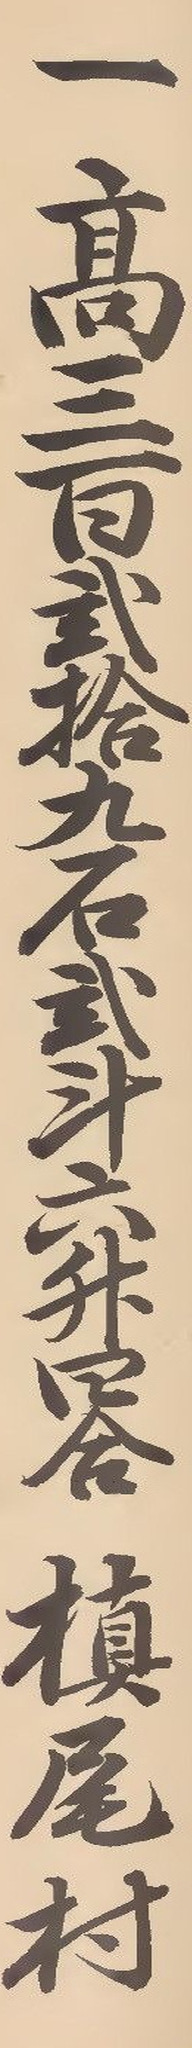一高三百弐拾九石弐斗六升四合槙尾村
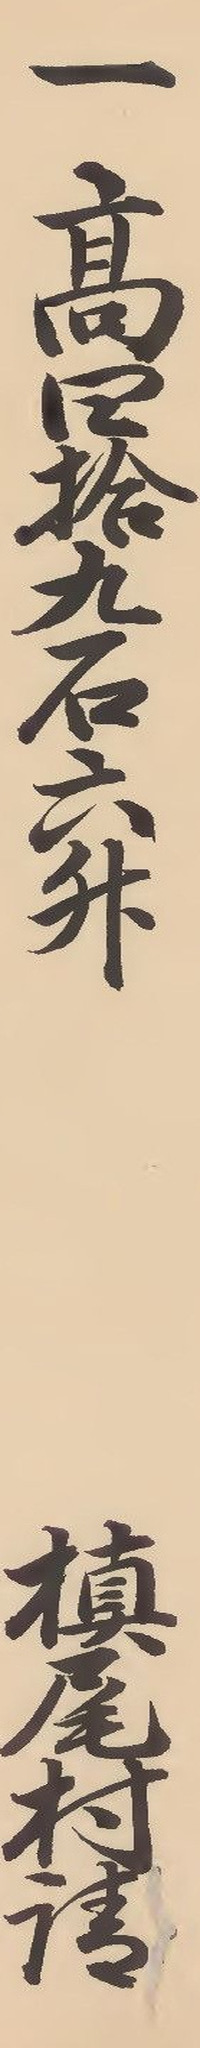一高四拾九石六升槙尾村請
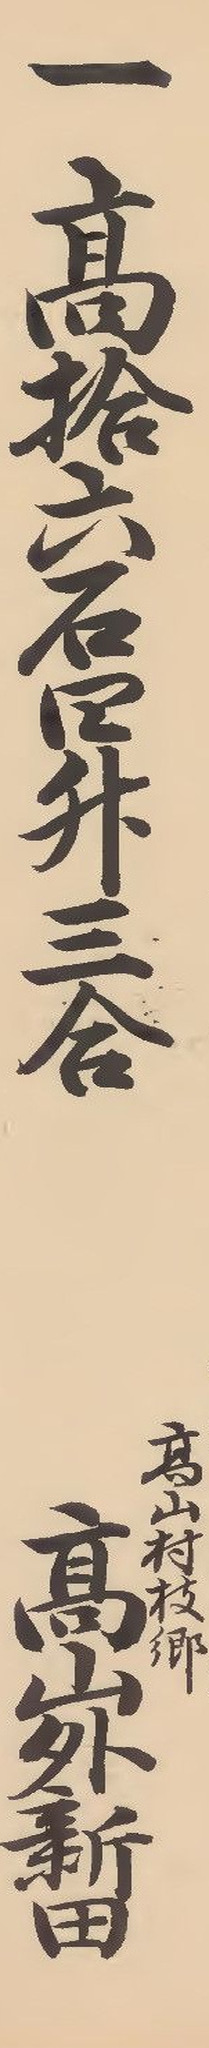一高拾六石四升三合高山外新田
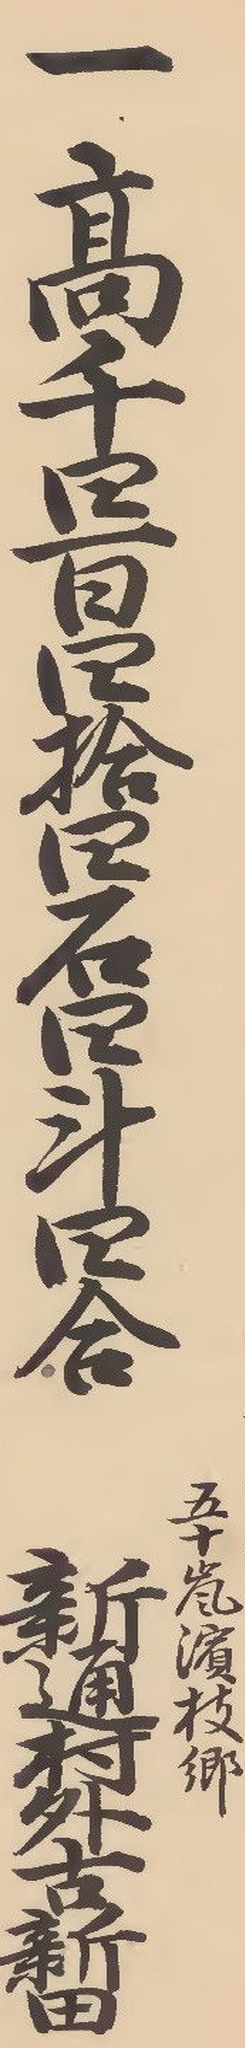一高千四百四拾四石四斗四合新通村外古新田
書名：越後国郷帳　下
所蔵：国立公文書館 National Archives of Japan
